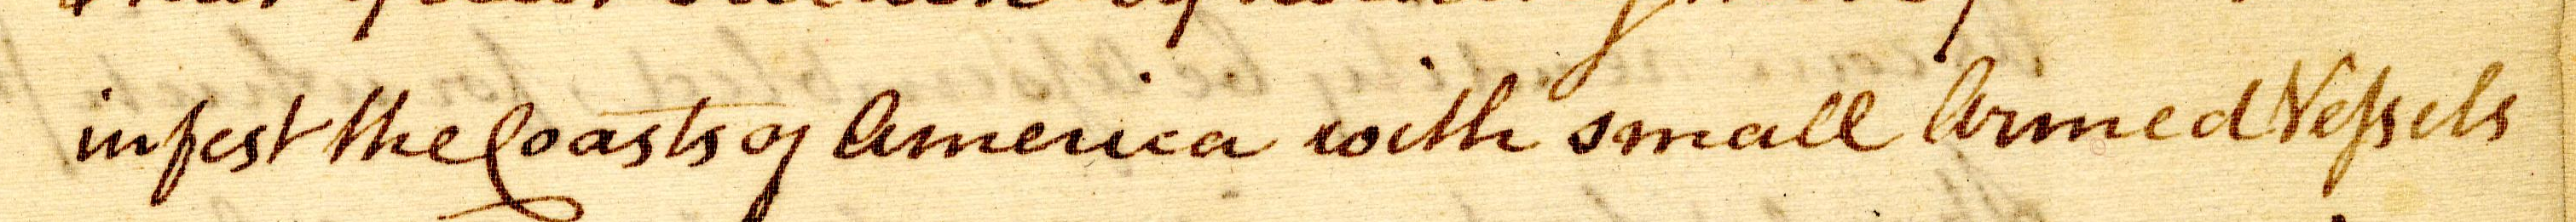infest the Coasts of America with small Armed Vessels
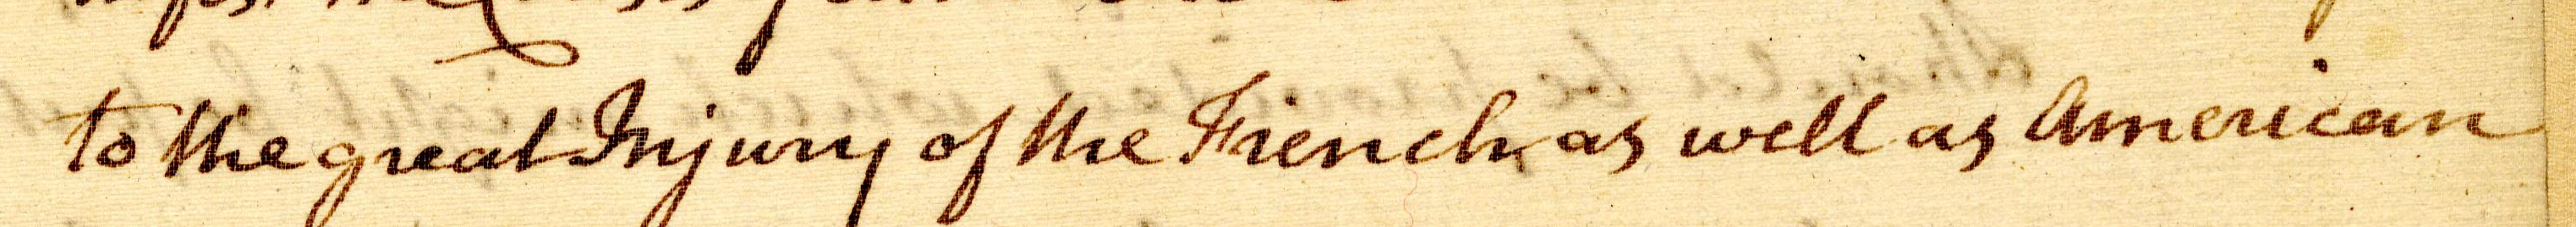to the great Injury of the French as well as American
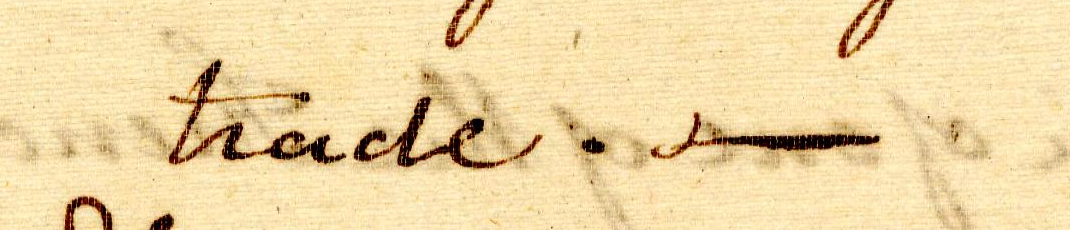trade.-
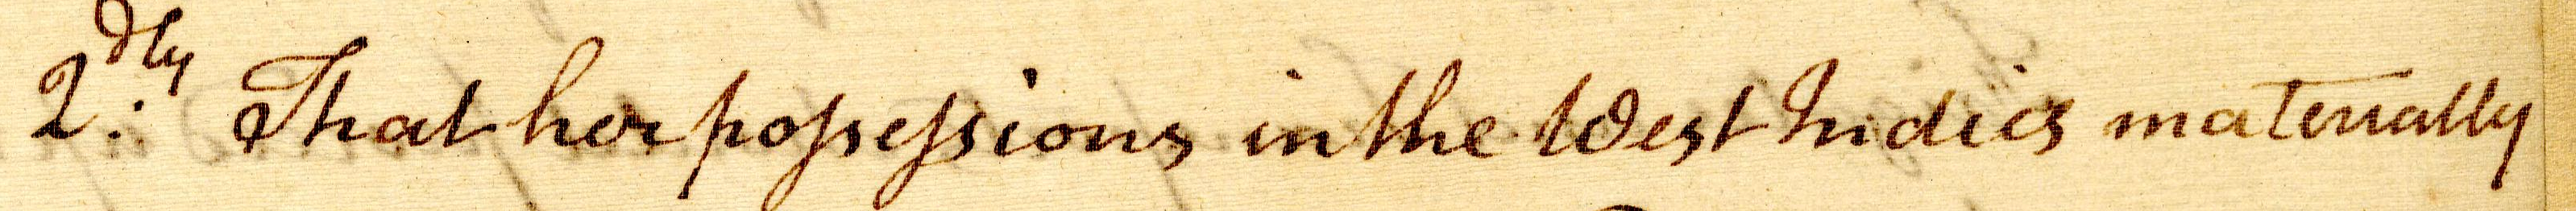2^dly: That her possessions in the West Indies materially
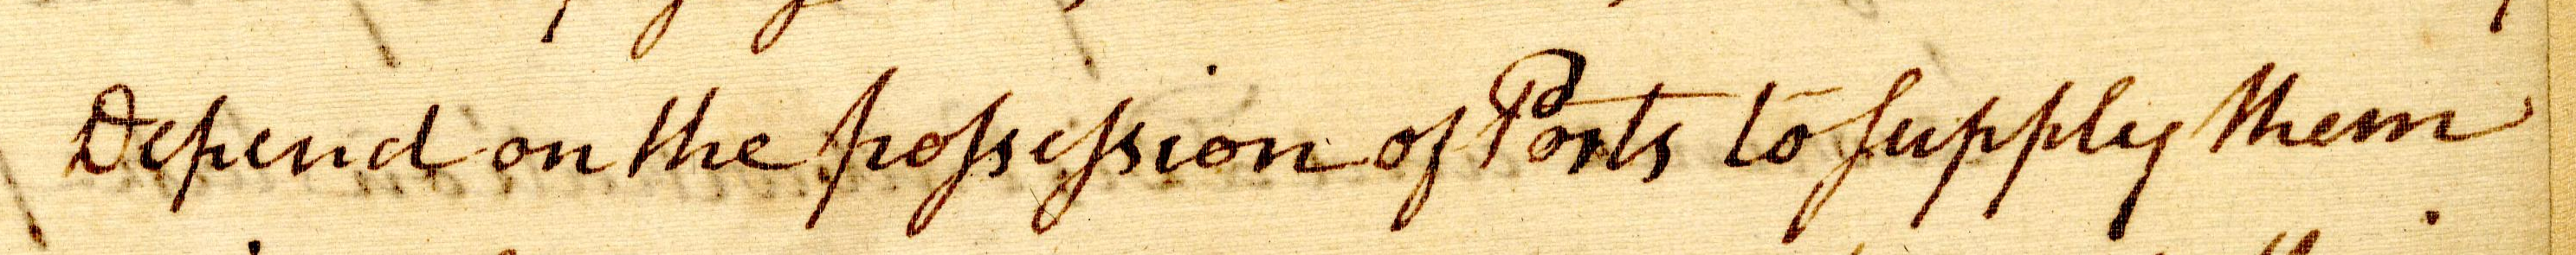Depend on the possession of Ports to supply them
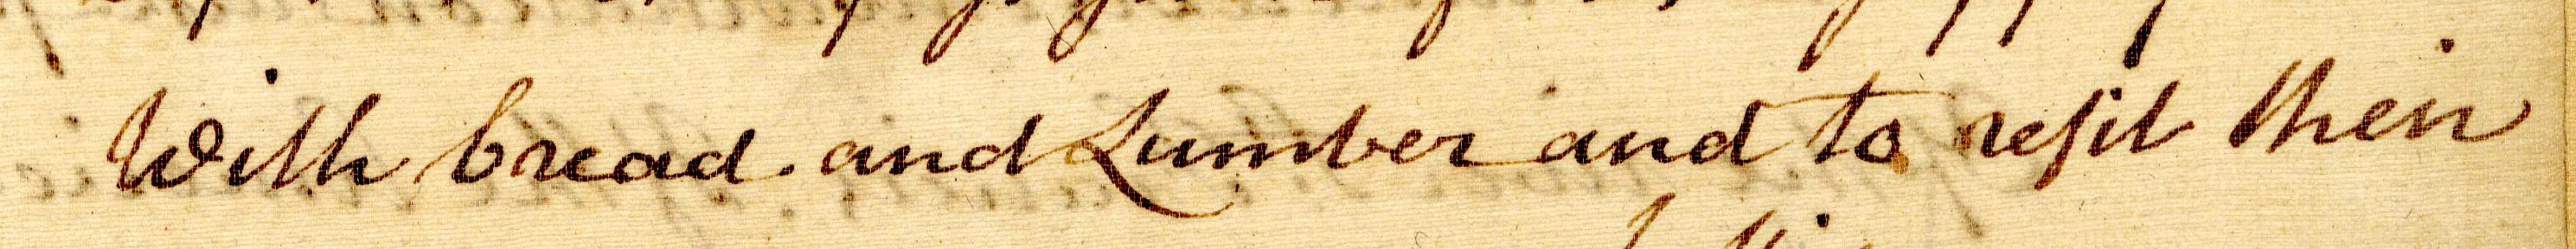Withe bread and Lumber and to refil their
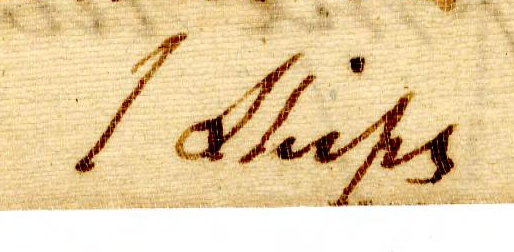Ships
